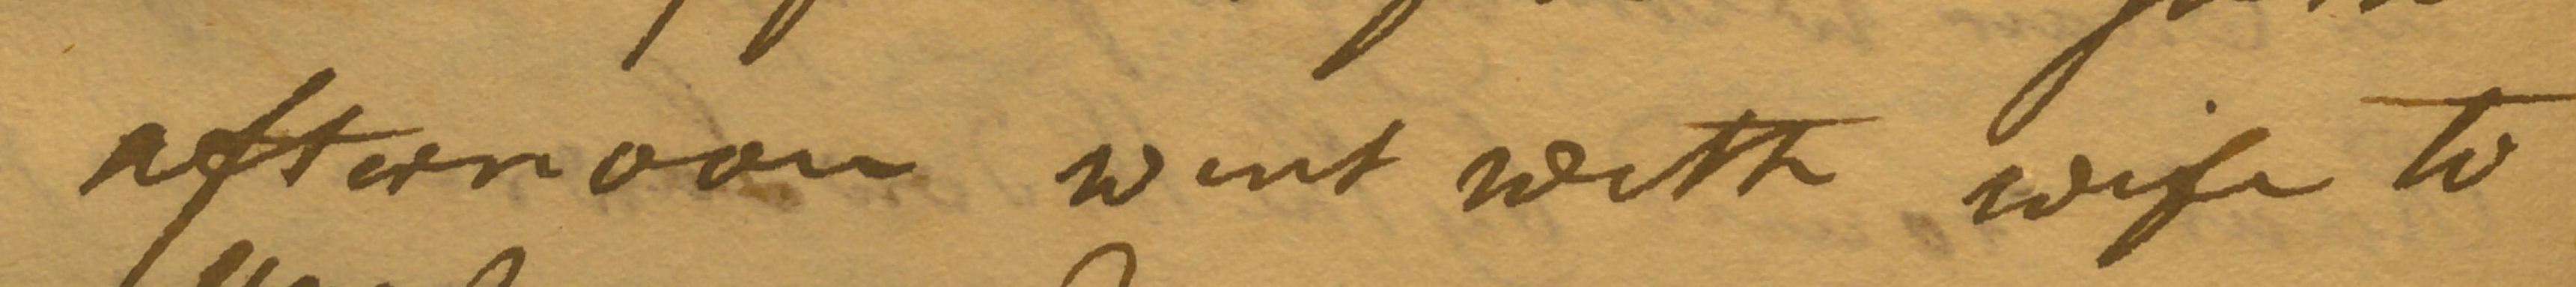afternoon went with wife to
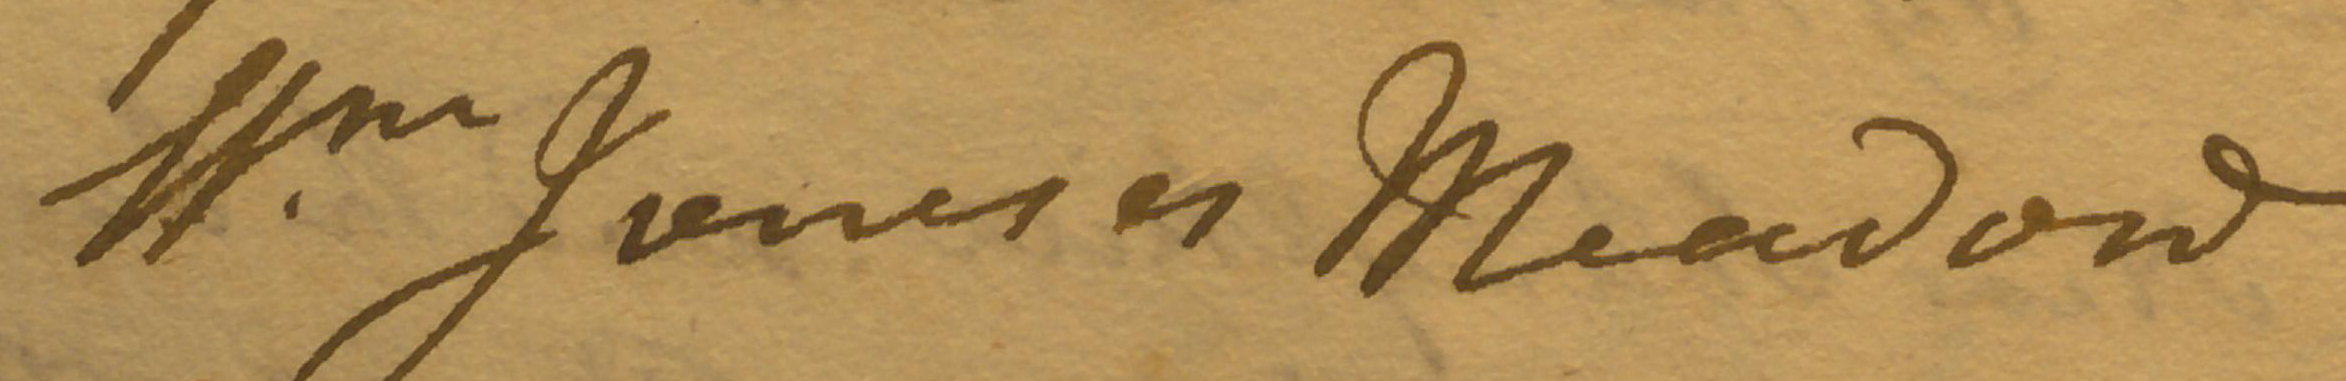W^m. Joneses Meadow
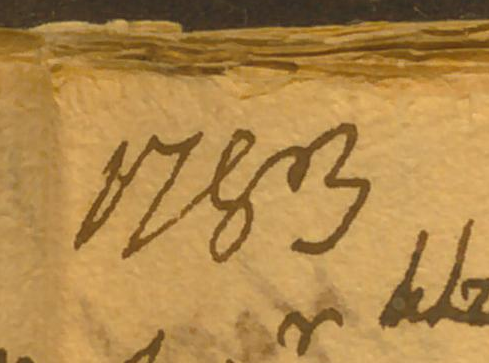1783
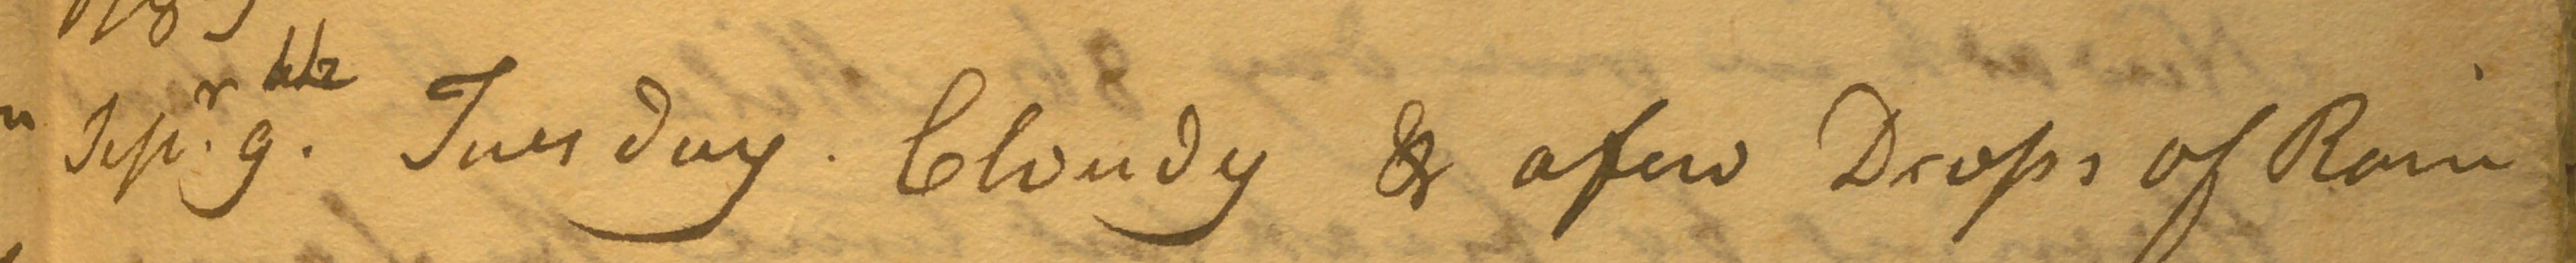Sep^r. 9^th. Tuesday. Cloudy & a few Drops of Rain
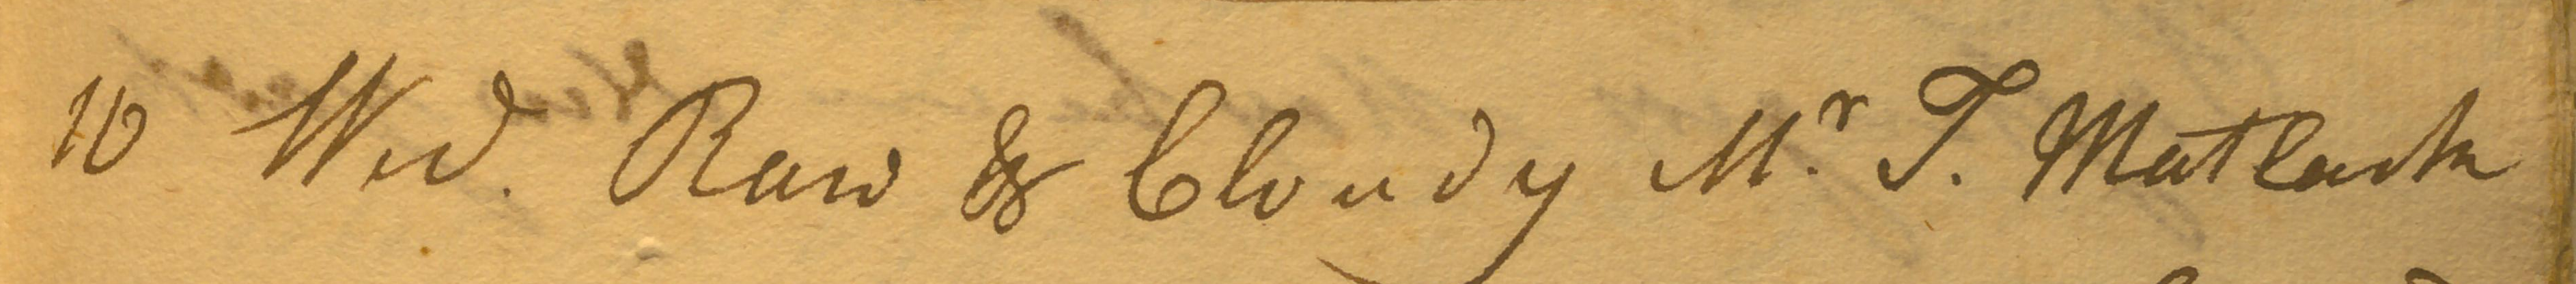10 Wed. Raw & Cloudy M^r. T. Matlack
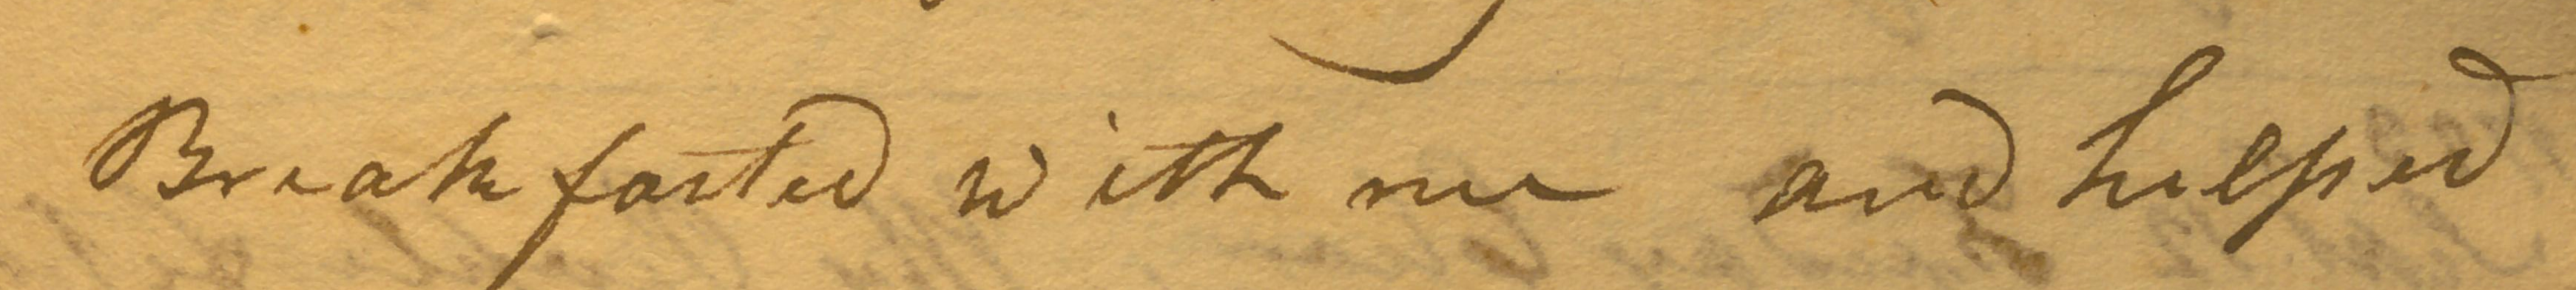Breakfasted with me, and helped
